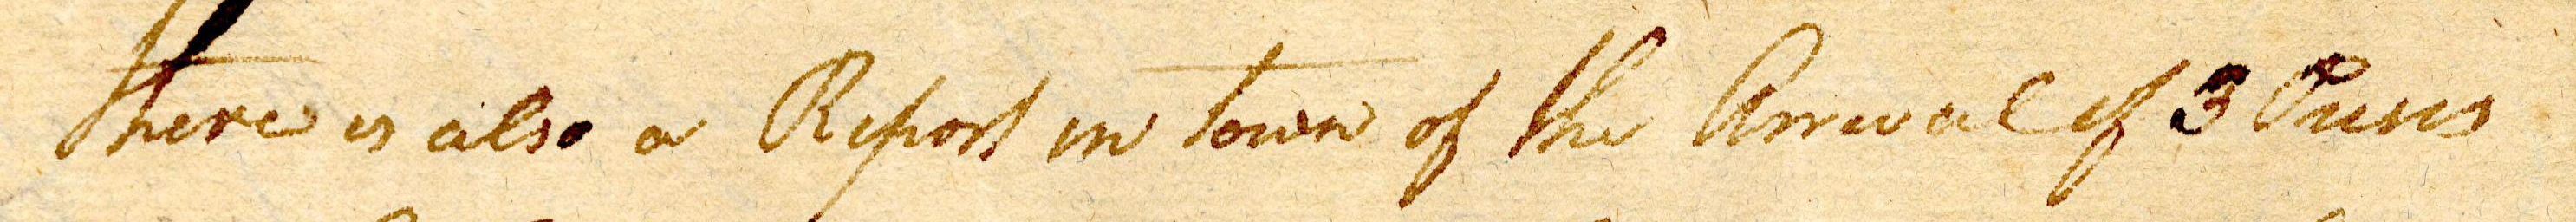There is also a Report in town of the Arrival of 3 Pairs
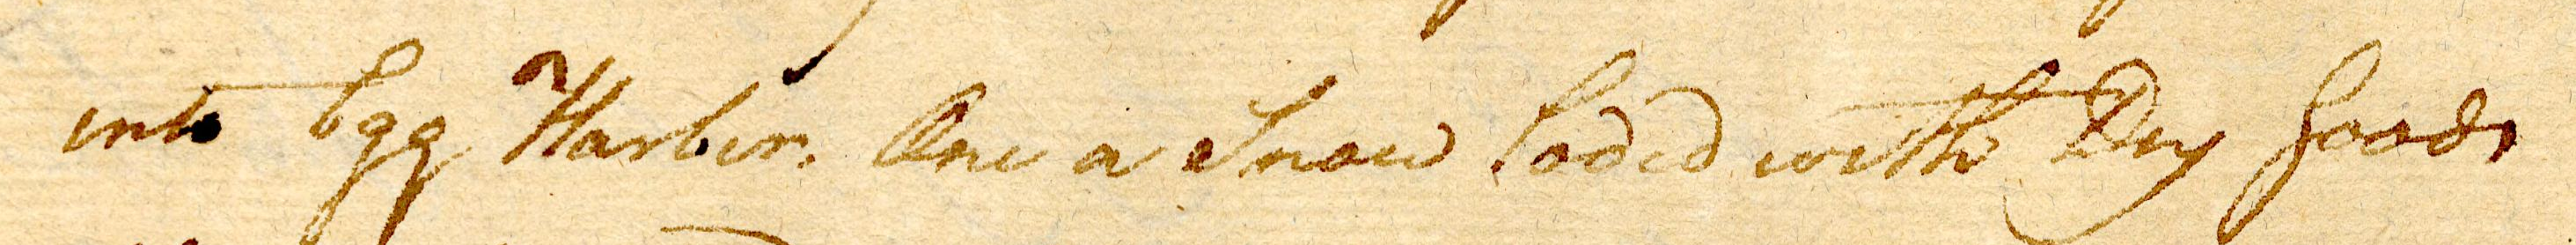into Egg Harber. One a Snow loded with Dry Goods
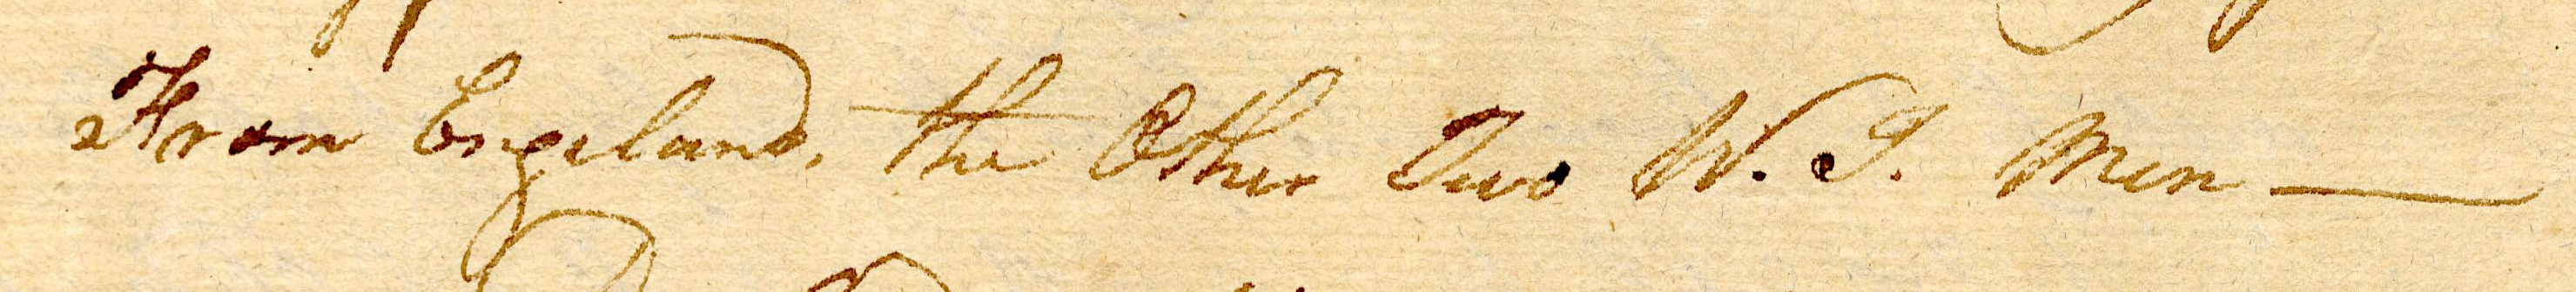From England, the other Two W. J. Men.-
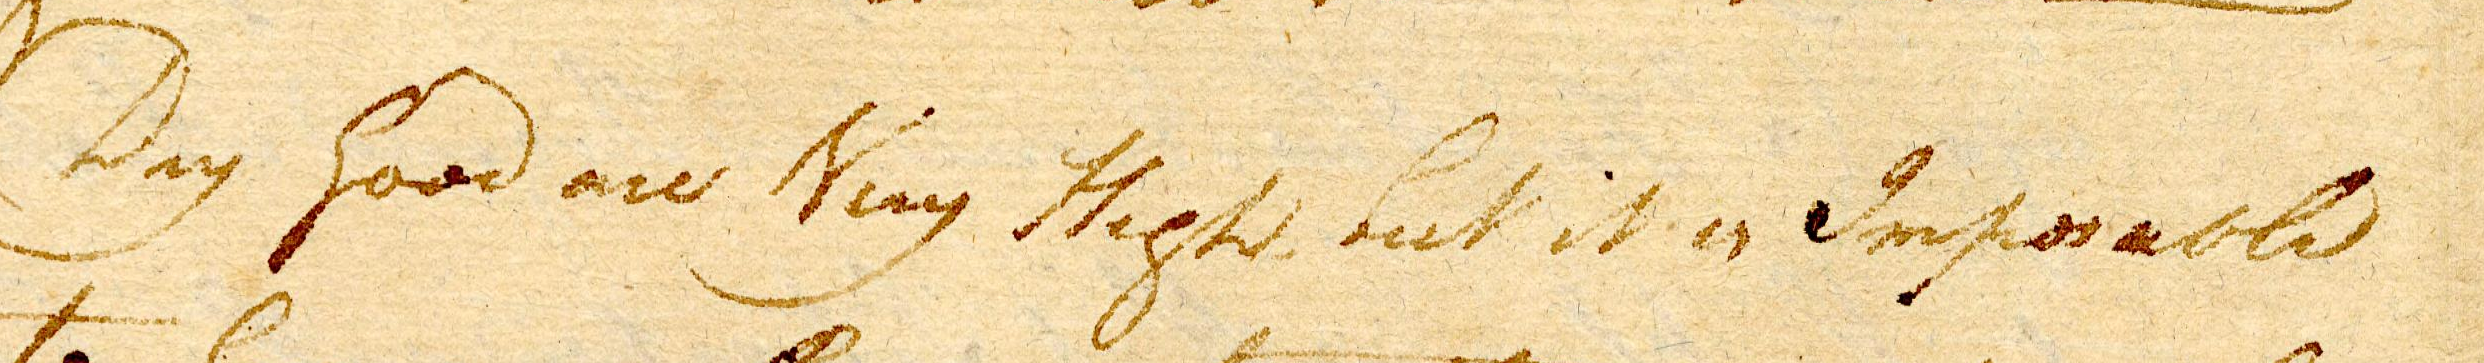Dry goods are Very High but it is Imposable
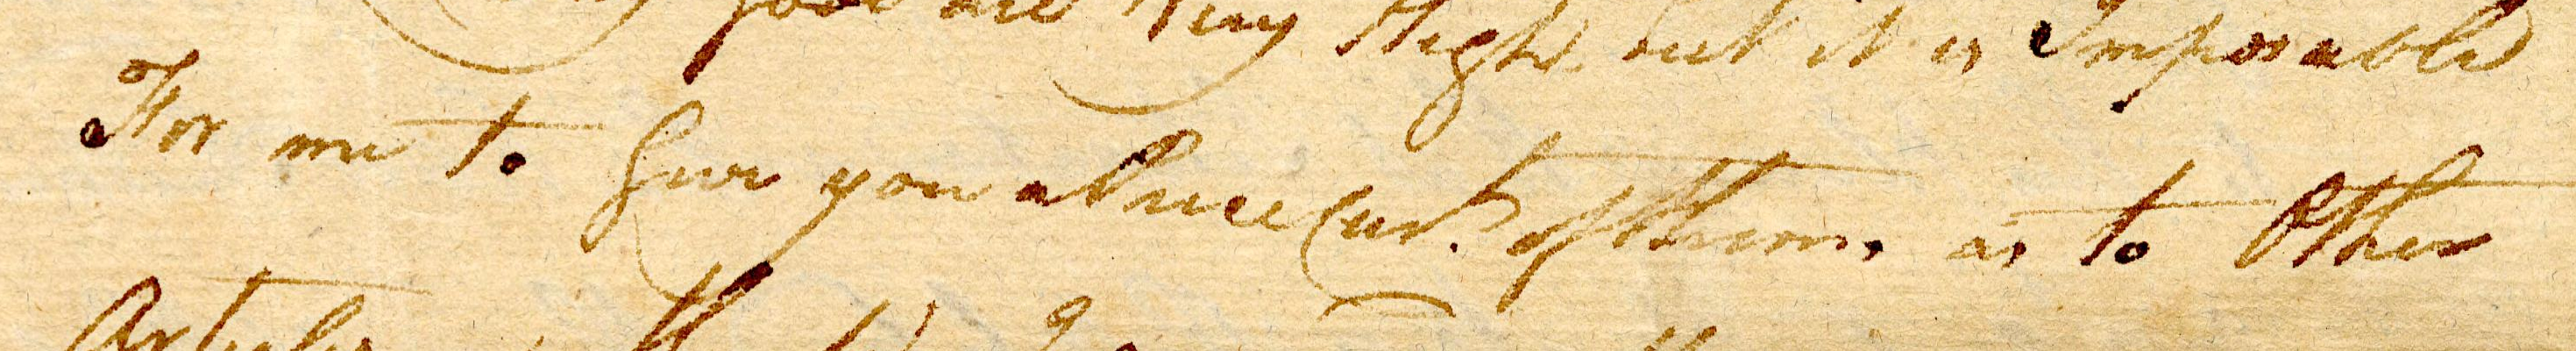For me to give you a price cur^t. of them, as to other
